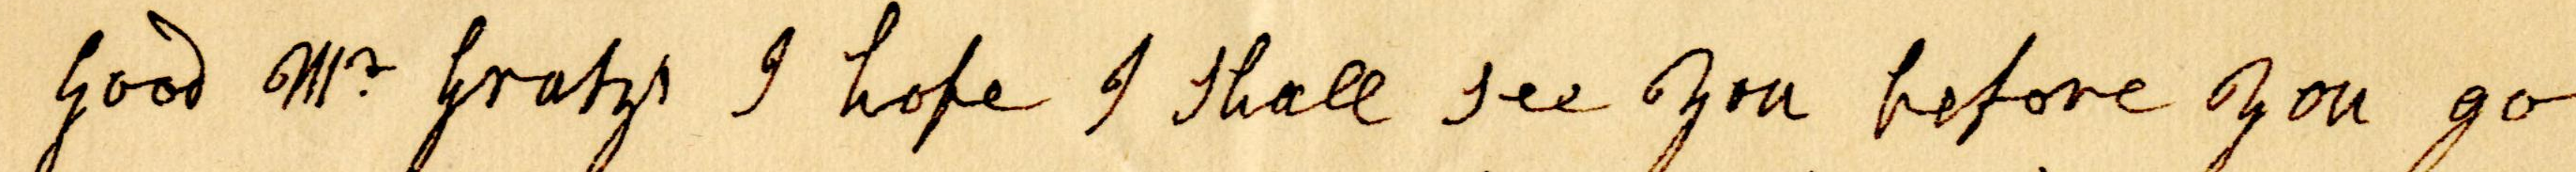Good M^r Gratz I hope I shall see you before you go
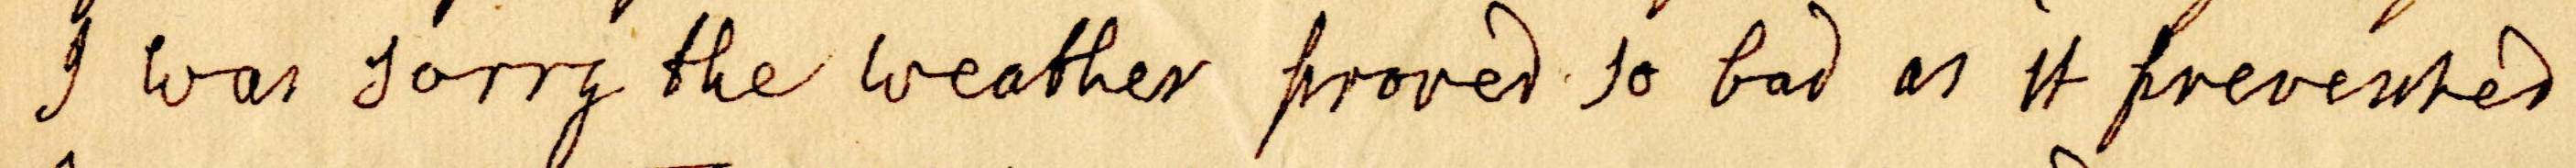I was sorry the weather proved sp bad as it prevented
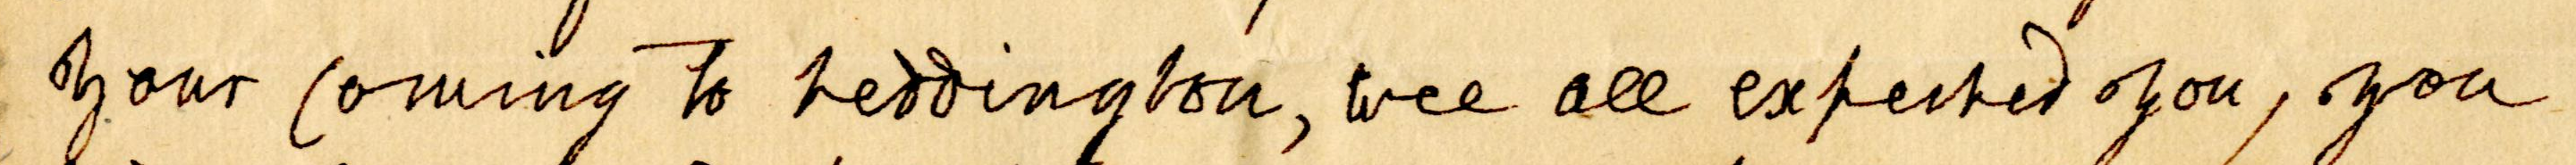your coming to heddington, wee all expected you, you
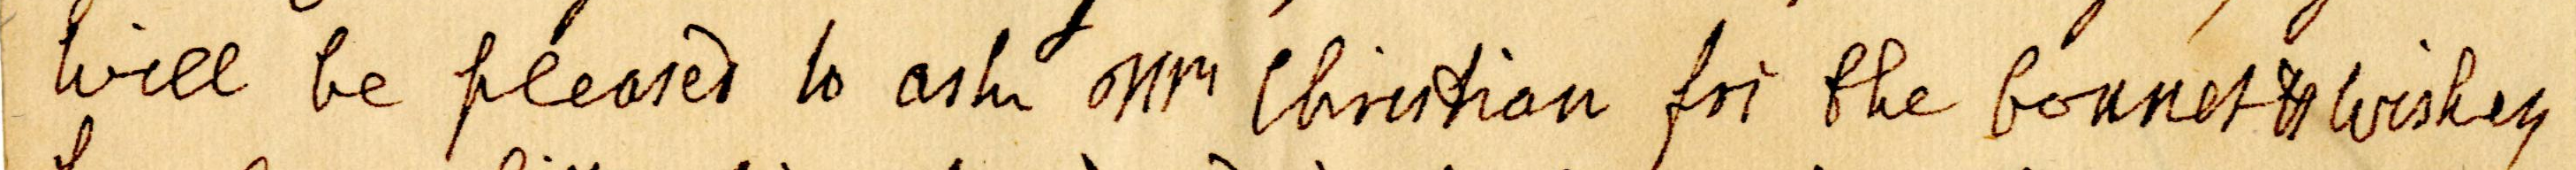will be pleased to ask M^r Christian for the bonnet & wiskey
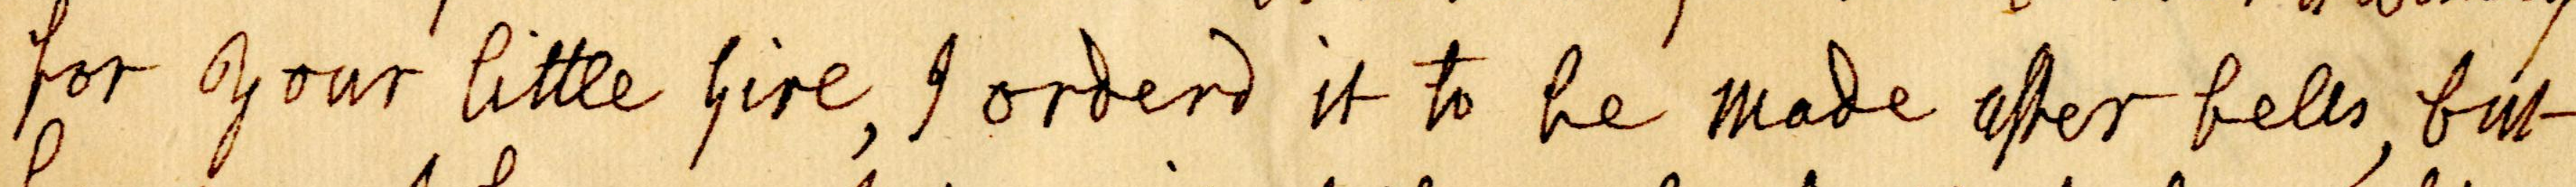for your little Girl, I orderd it to be made after bells, but
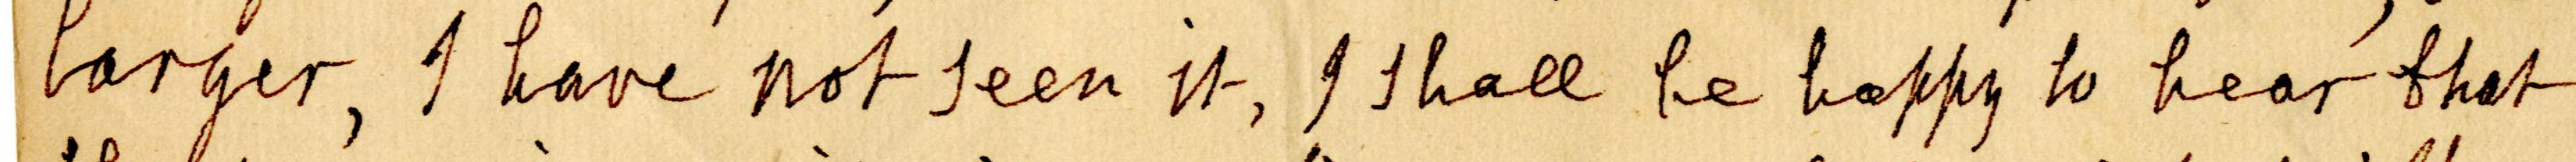larger, I have not seen it, I shall be happy to hear that
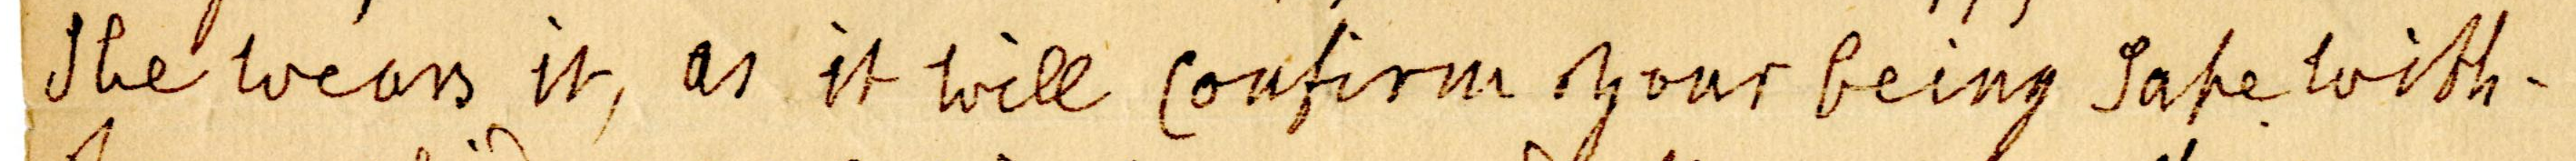she wears it, as it will confirm your being safe with
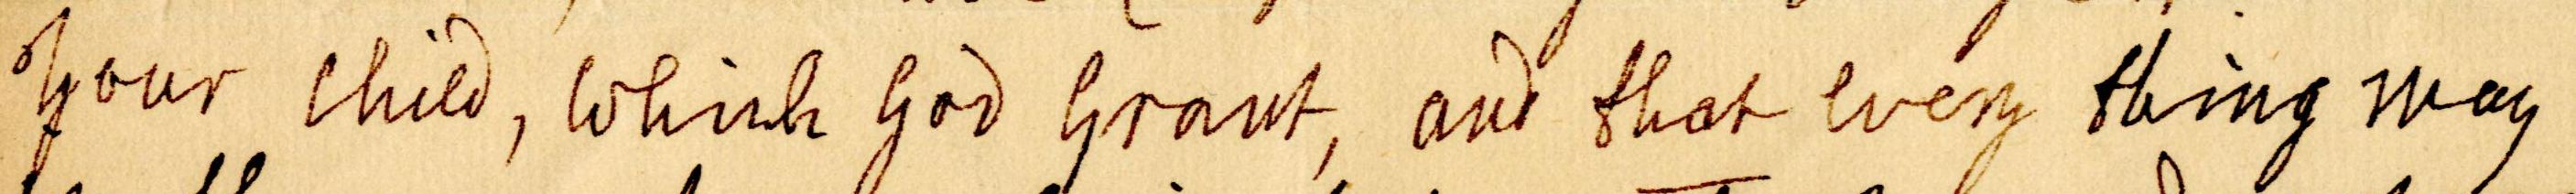your child, which God grant, and that every thing may
